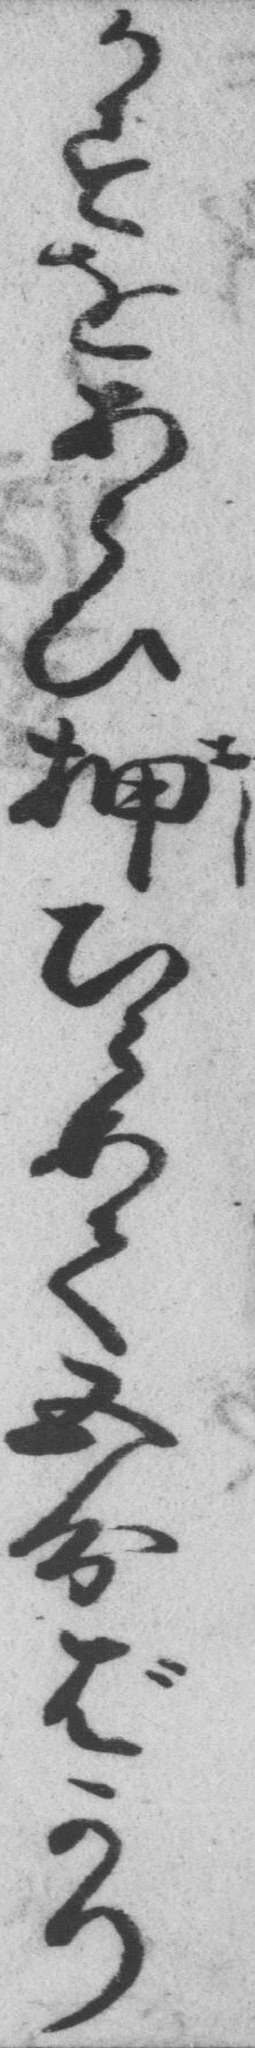かすをあらひ押ひらめて五分ばかり
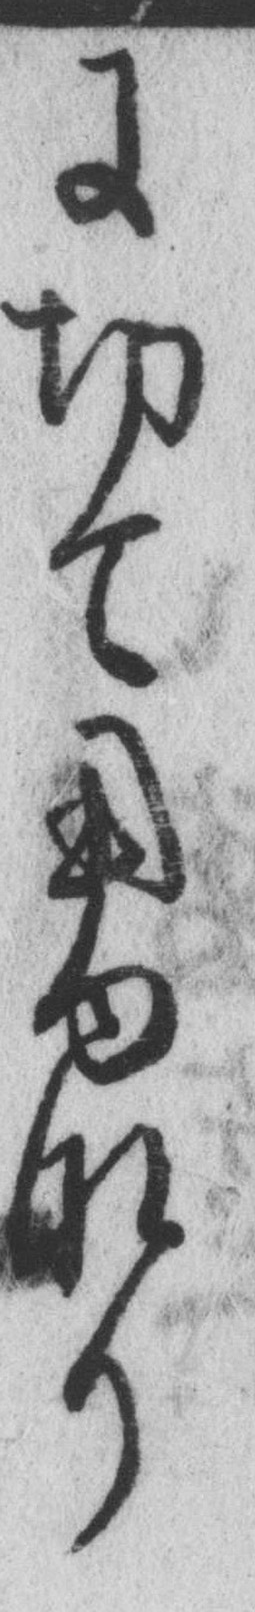に切て用ゆなり
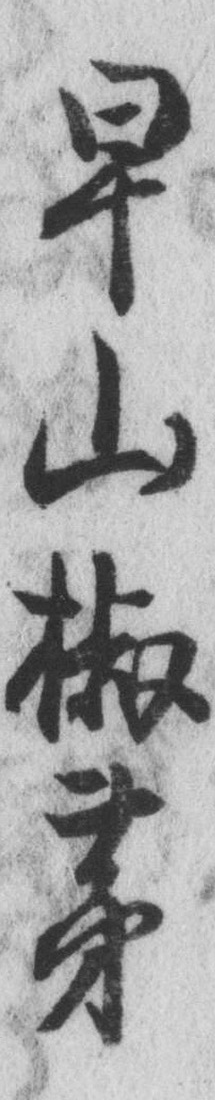早山椒芽
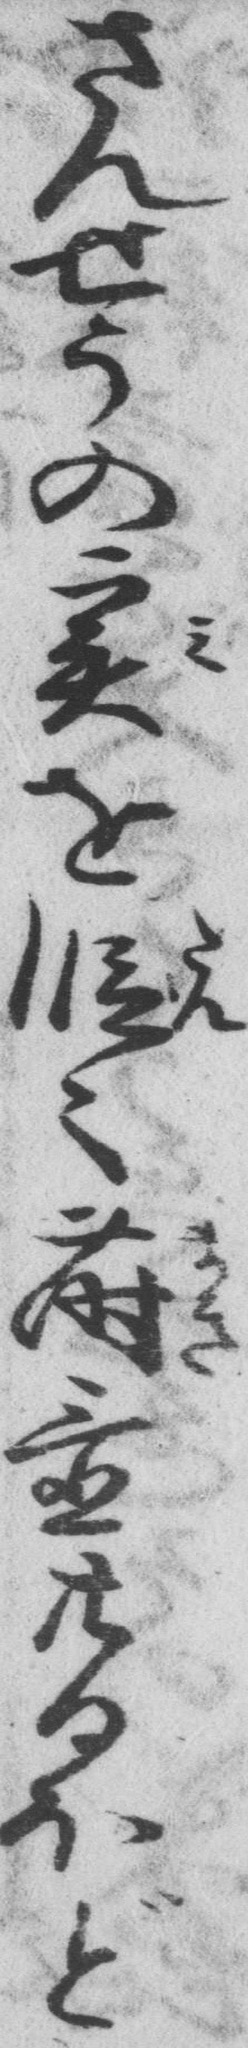さんせうの実を段々蒔置廿日ほど
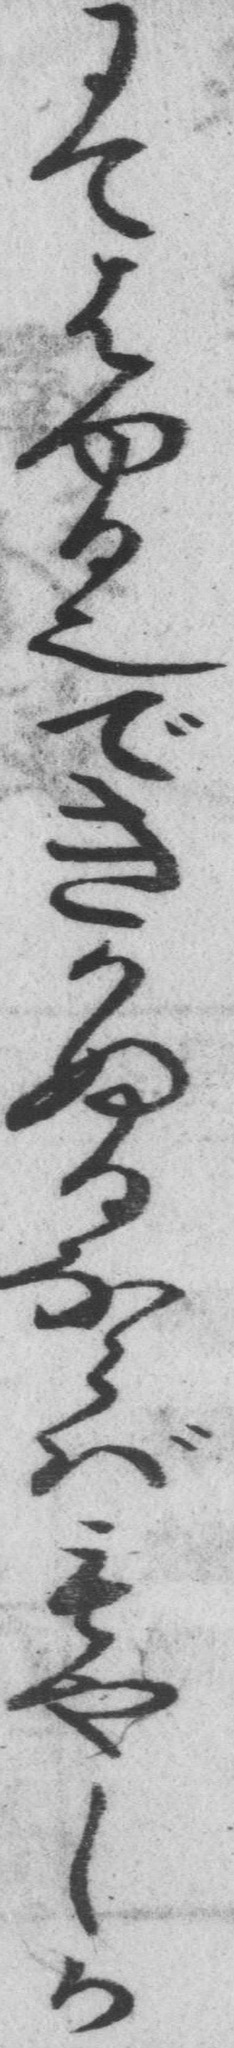にてはゆる也できかぬるならばもやしか
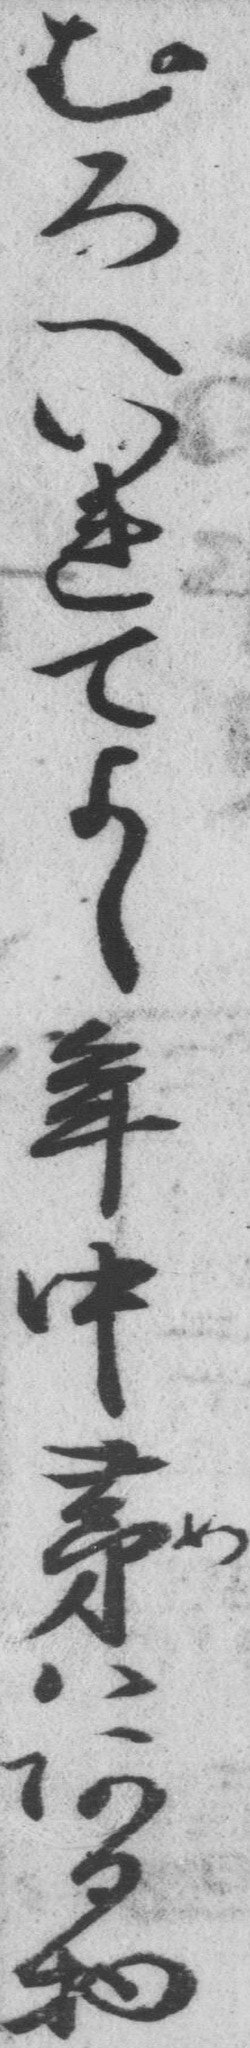むろへいれてよし年中芽はある物
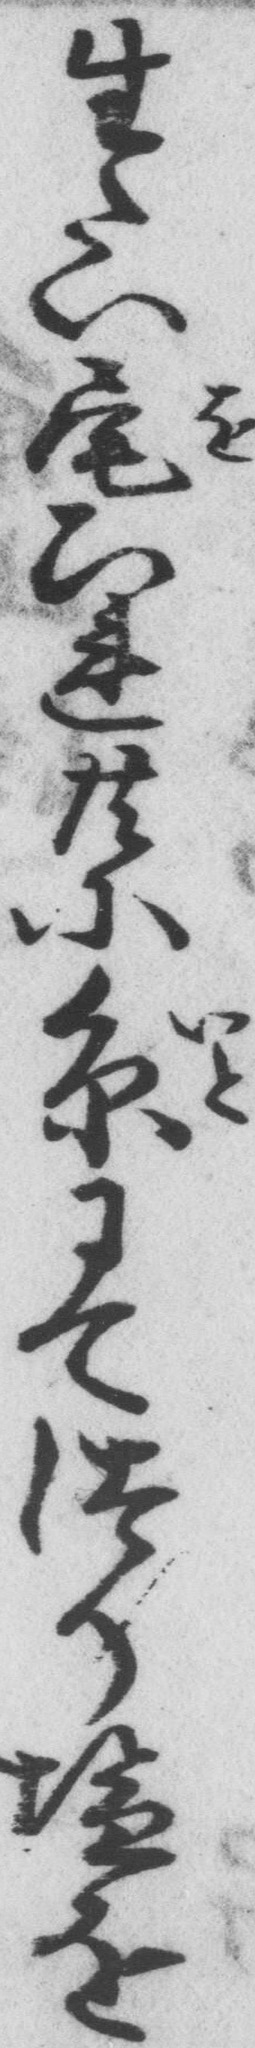生たい尾ひれ共に糸にてつり塩を
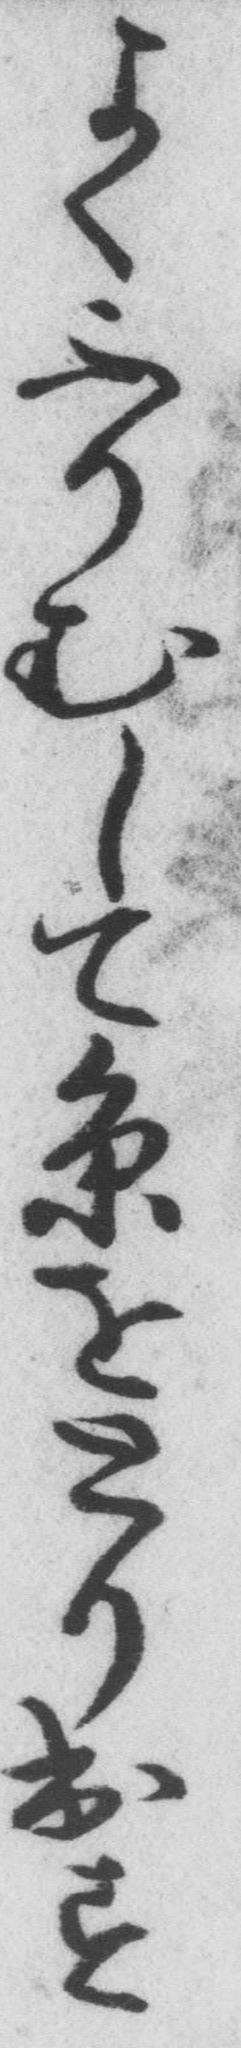よくふりむして糸をとり出す
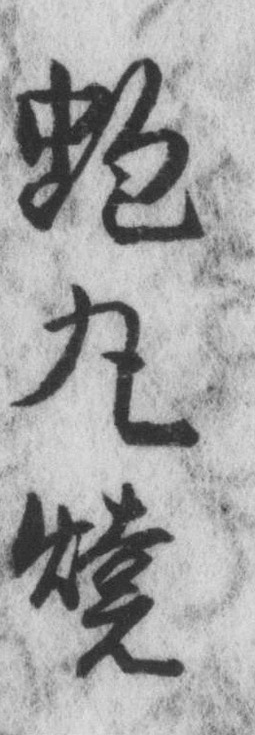鮑丸焼
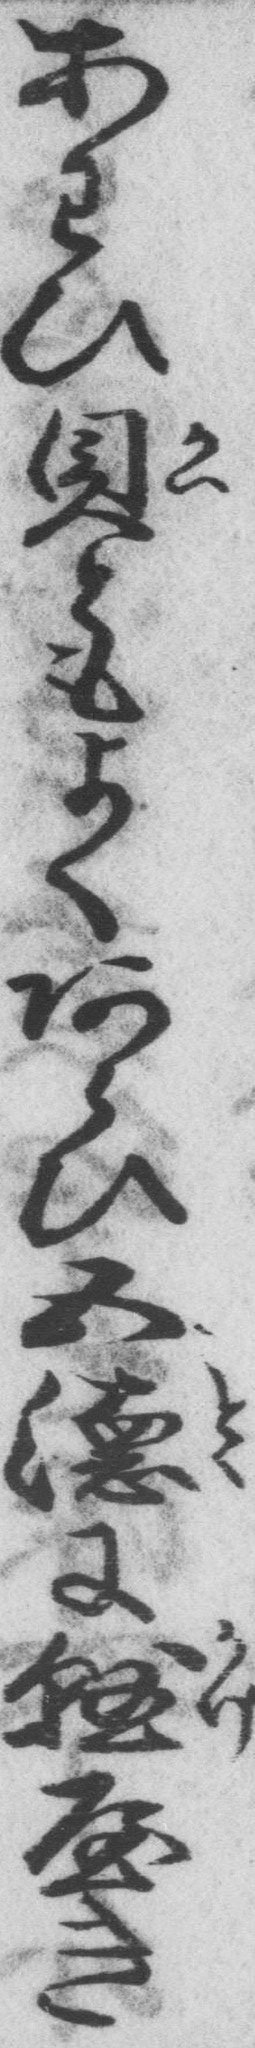あわひ貝ともよくあらひ五徳に懸やき
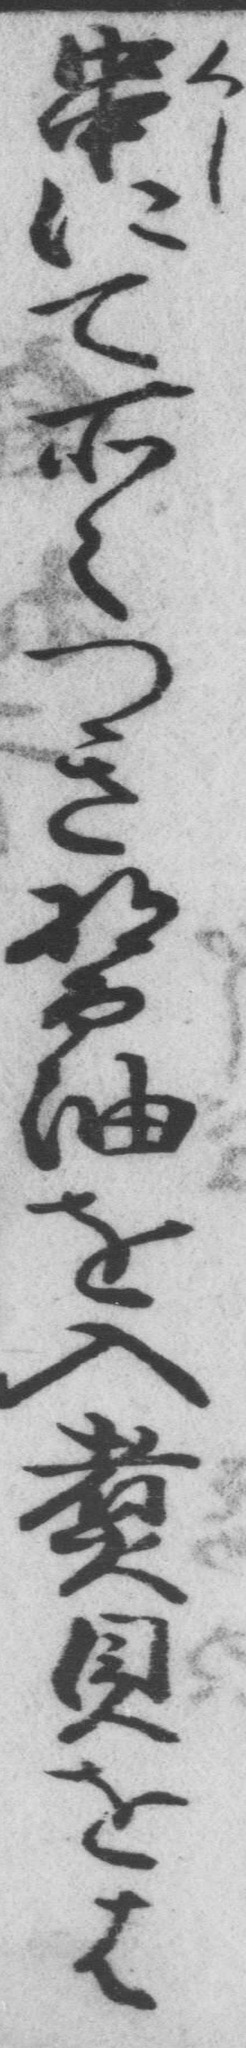串にて所々つき醤油を入煮貝をは
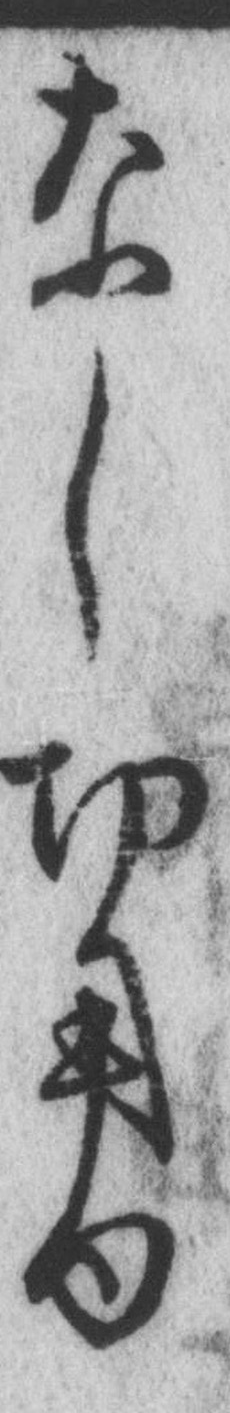なし切用ゆ

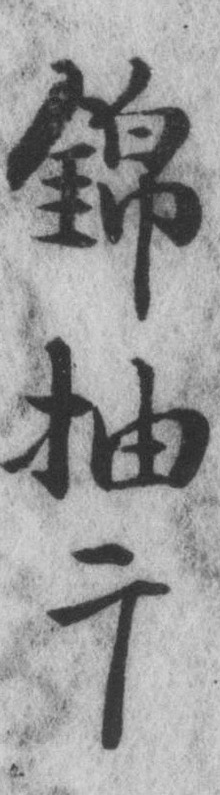錦柚干
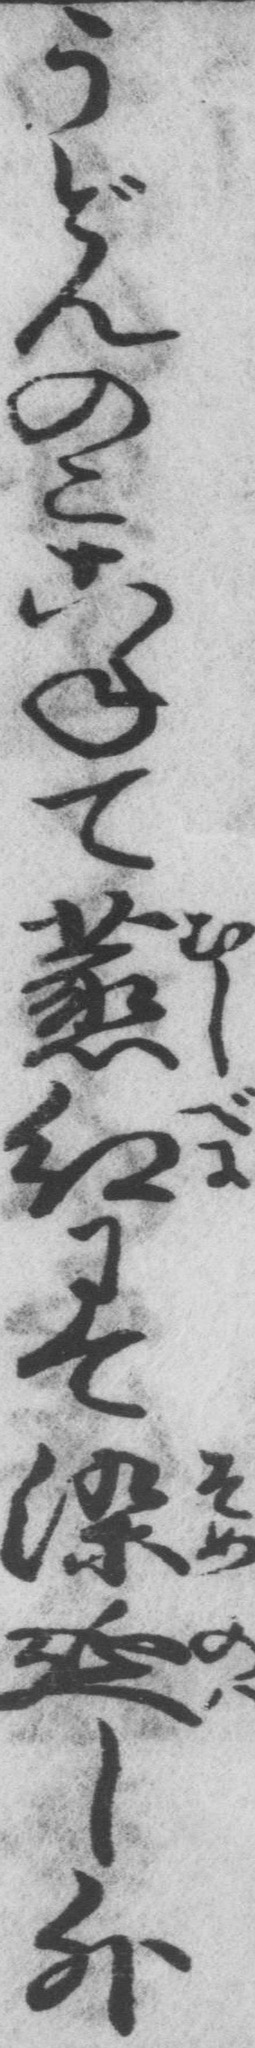うどんのここねて蒸紅にて染延し外
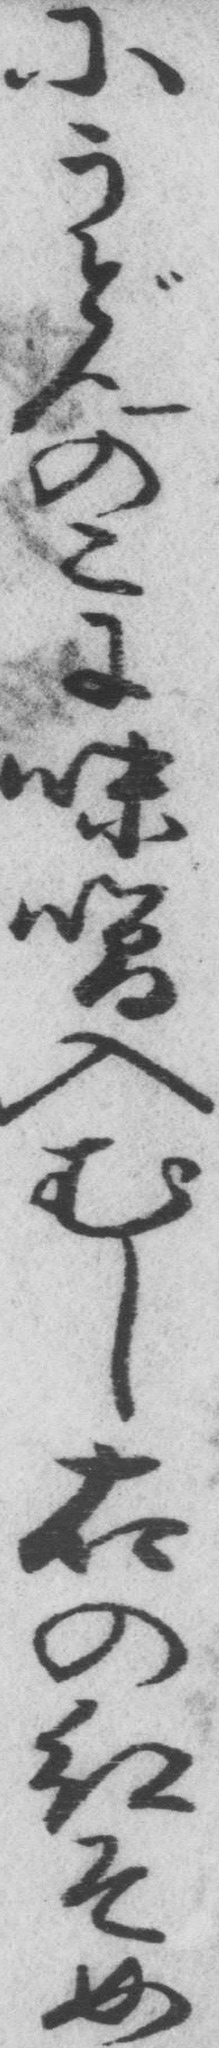にうどんのこに味噌入むし右の紅そめ
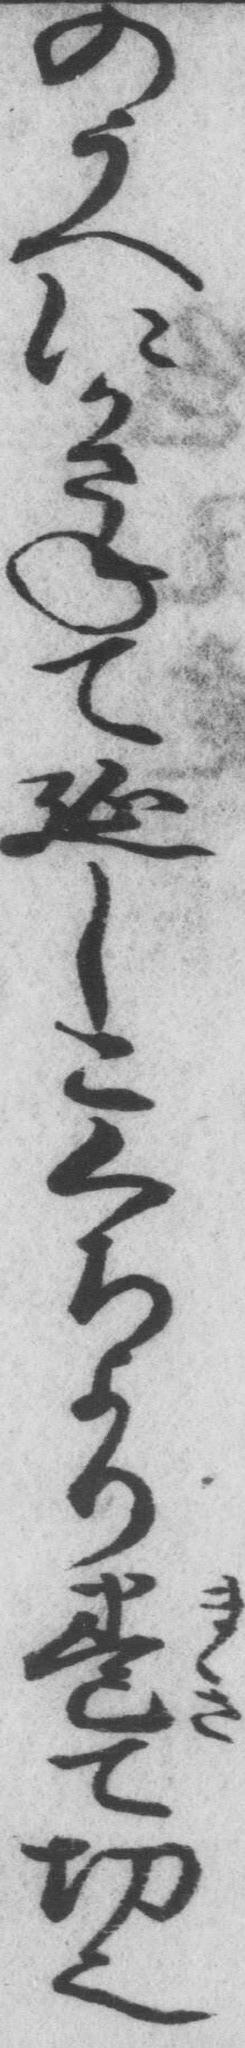のうへにかさねて延しこくちより巻て切也
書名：料理山海郷
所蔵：大阪府立大学学術情報センター 国文学研究資料館
